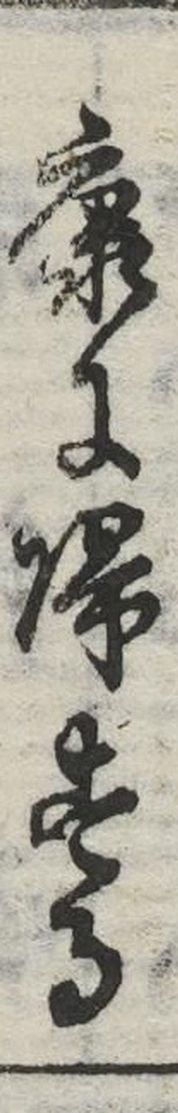康に帰する
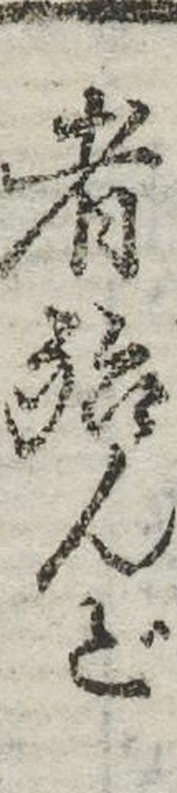者殆んど
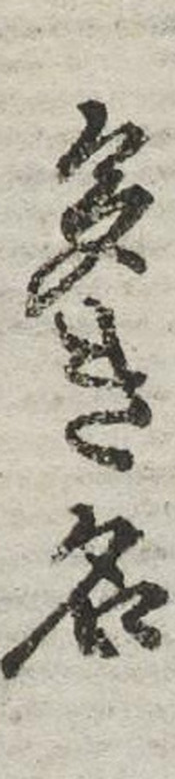多き名
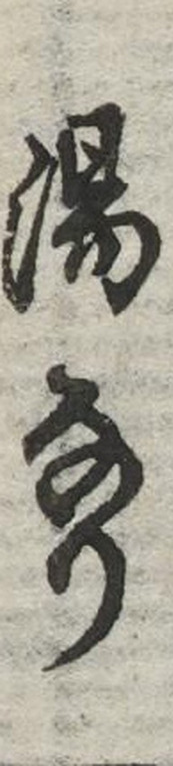湯なり

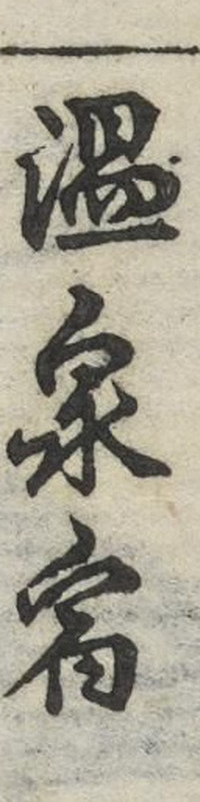温泉宿
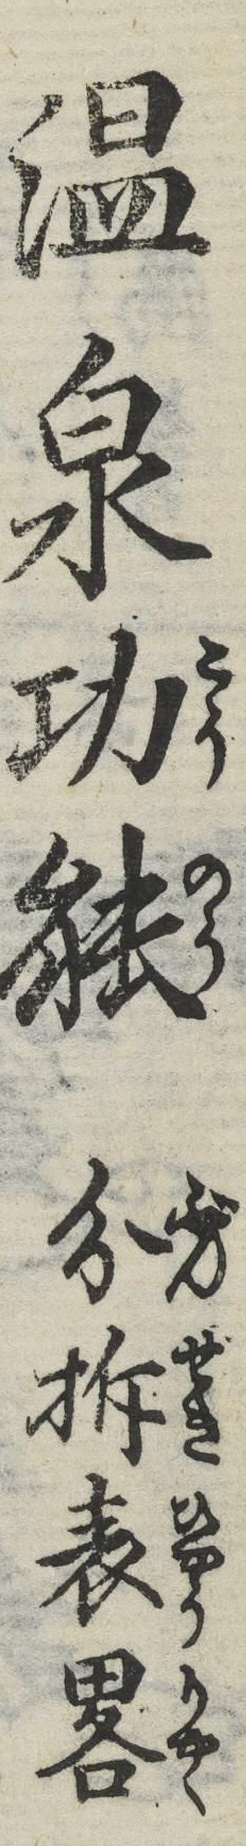温泉功能分析表略
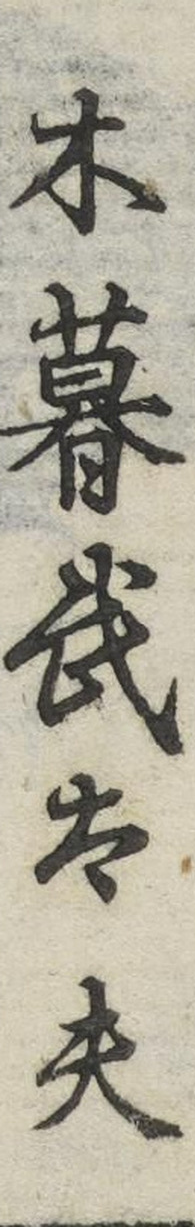木暮武太夫
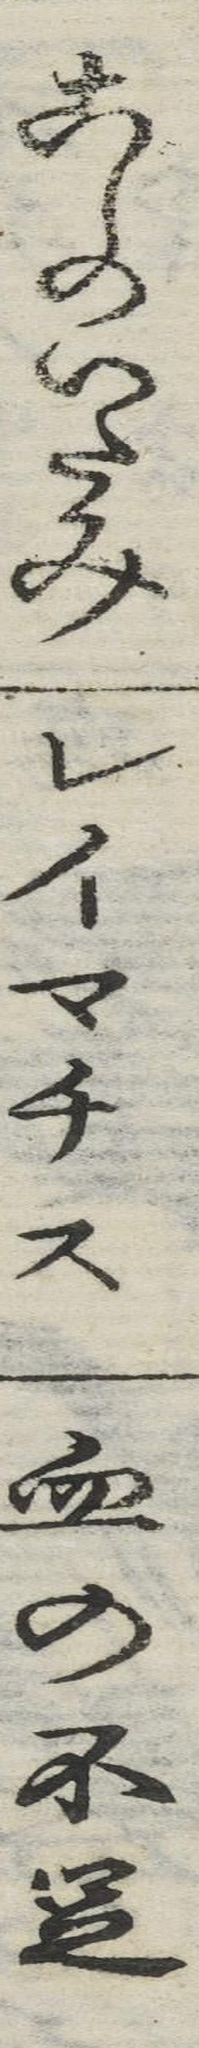こしのいたみレイマチス血の不足
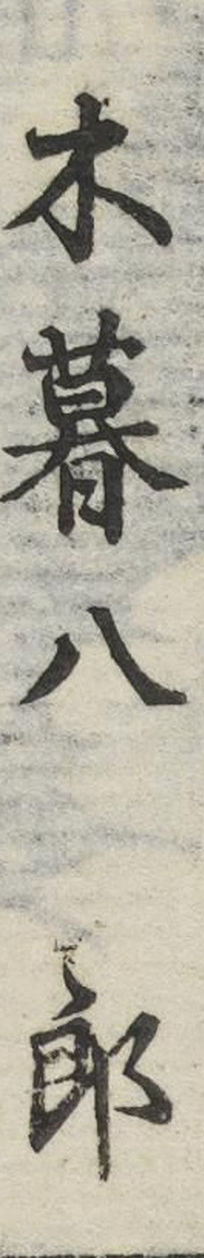木暮八郎
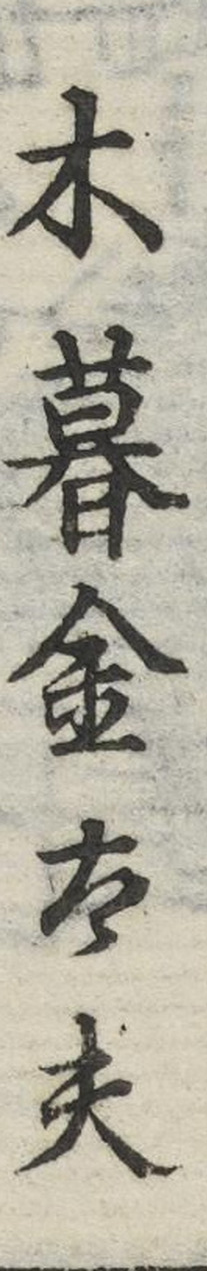木暮金太夫
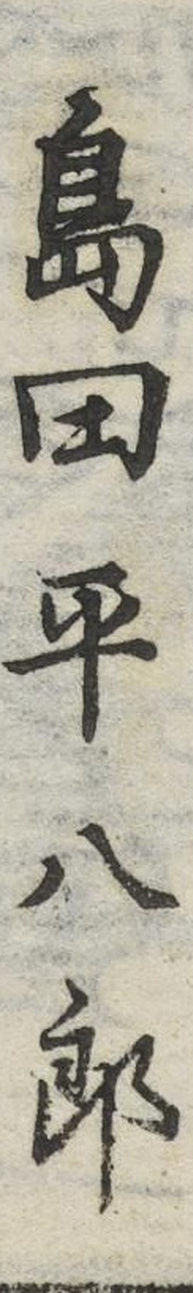島田平八郎
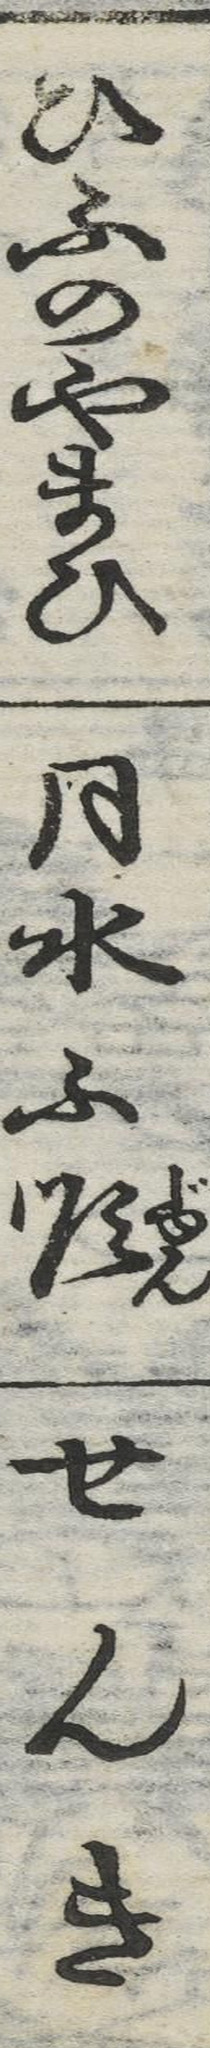ひふのやまひ月水ふ順せんき
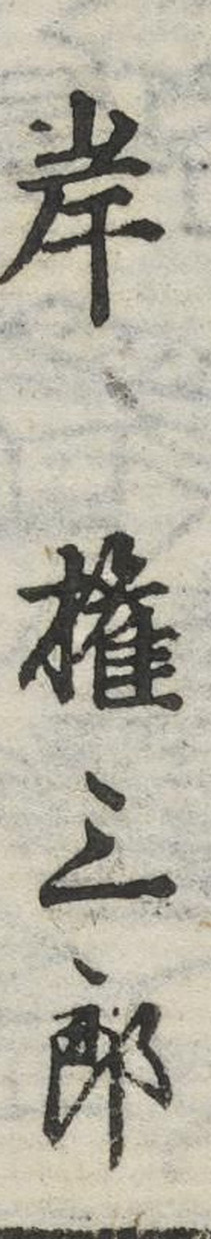岸権三郎
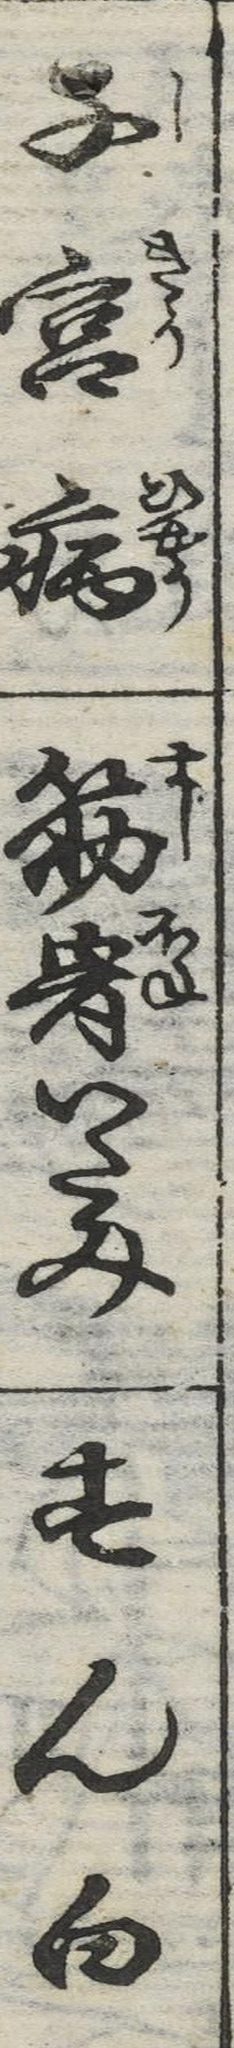子宮病筋骨いたみすん白
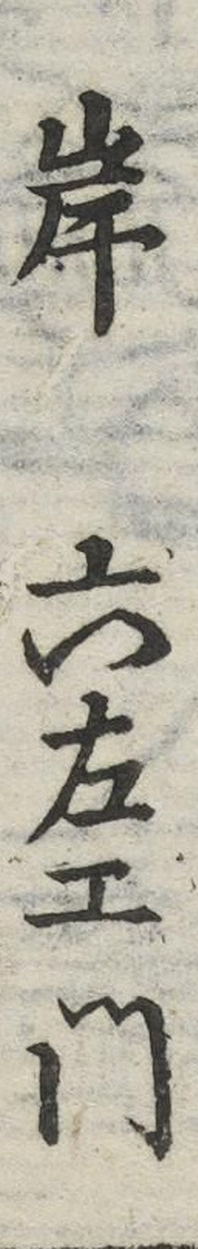岸六左エ門
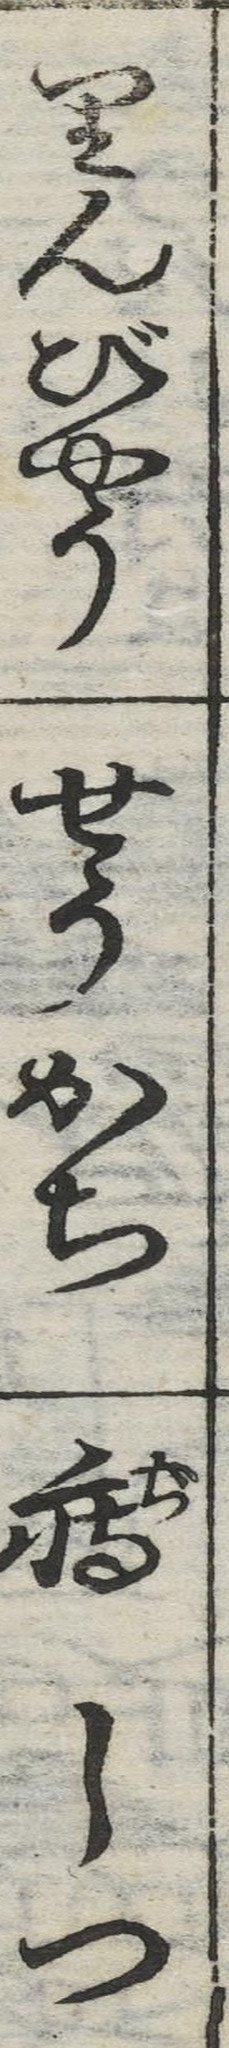りんびやうせうかち痔しつ
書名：諸國温泉遊覽記　全
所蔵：東京大学地震研究所図書室 Earthquake Research Institute Library, The University of Tokyo, JAPAN
